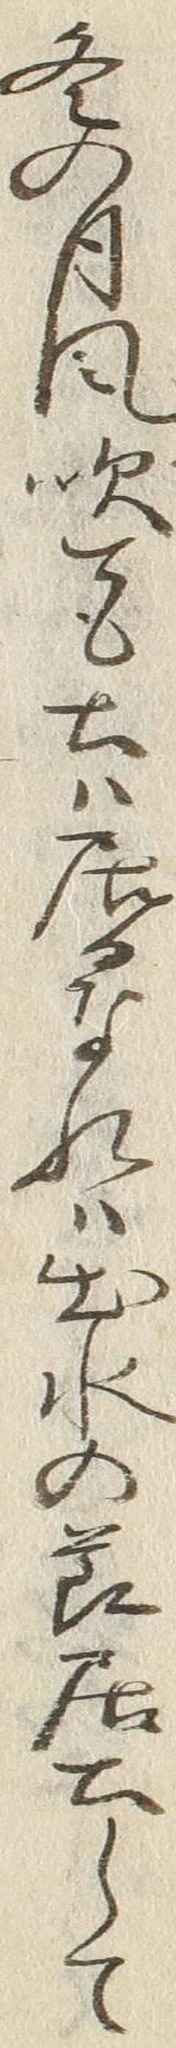冬の月風吹ても土は居るなれは出水の節居土して
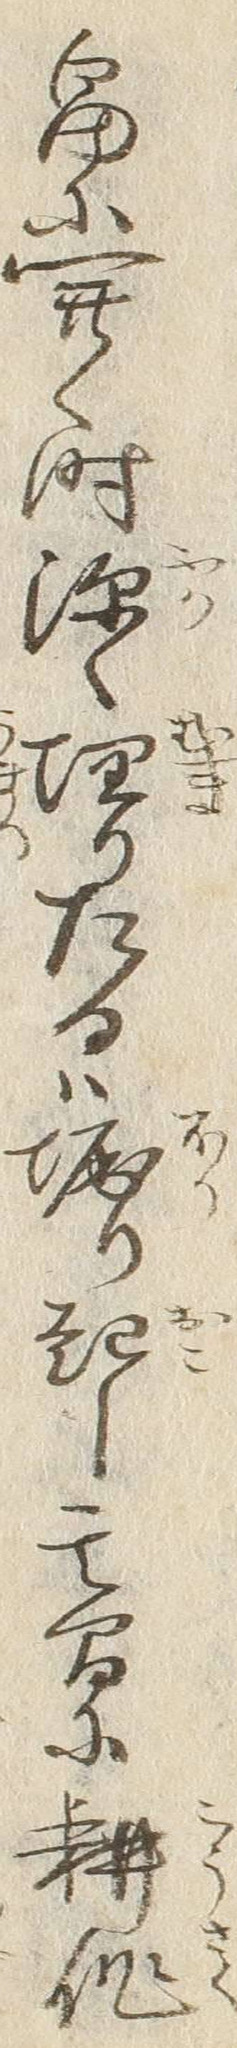畠尓開く時深く埋りたるは堀り起し其間尓耕作
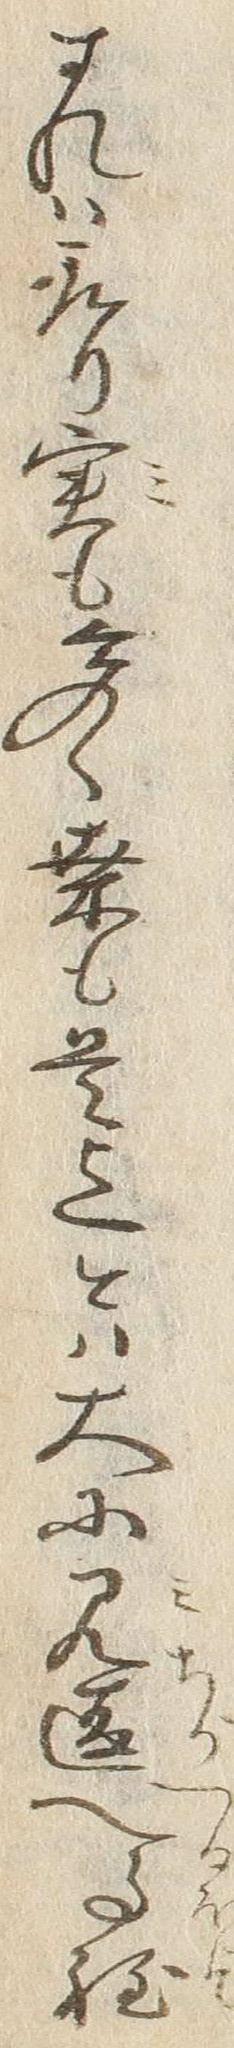すれは取り実も多く桑も是迄とは大尓見違へる程

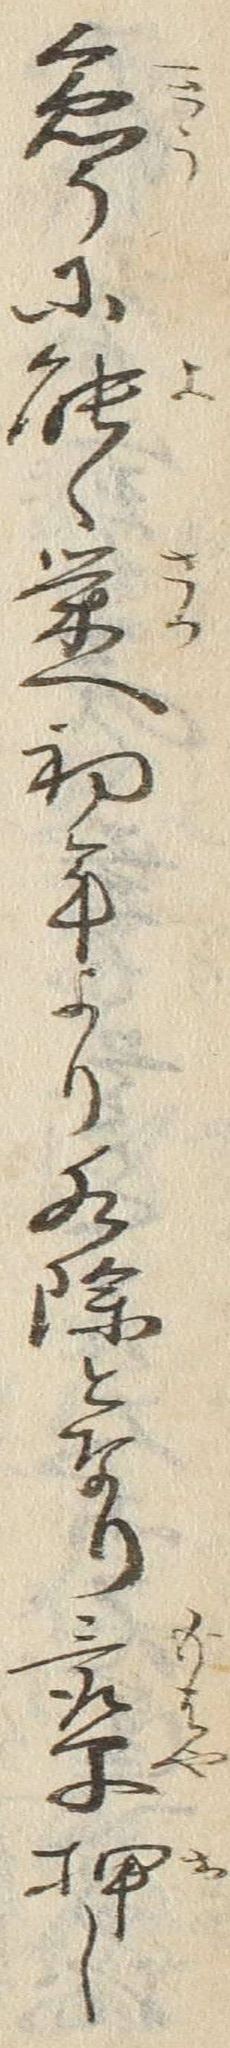急う尓能く栄へ初年より水際となり最早押し
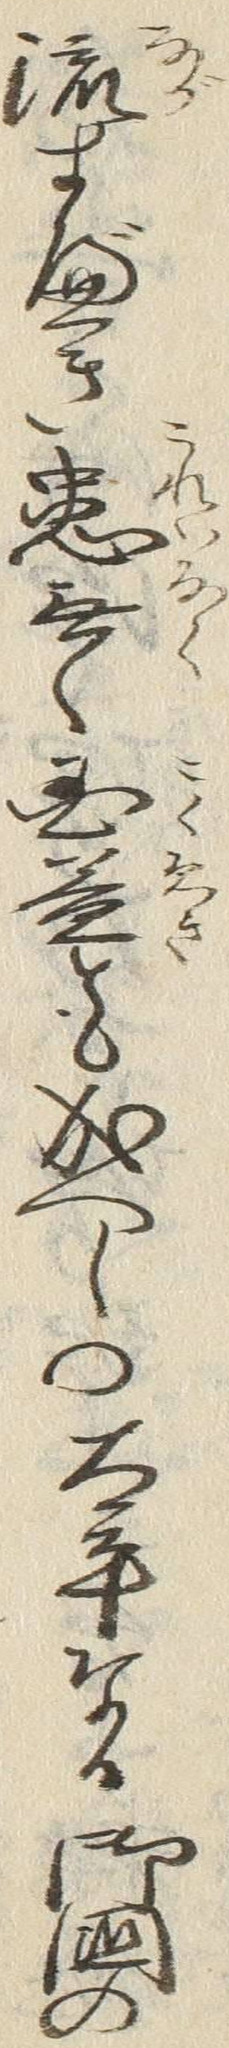流すべき患無く國益とも成へし〇太年なる御國の
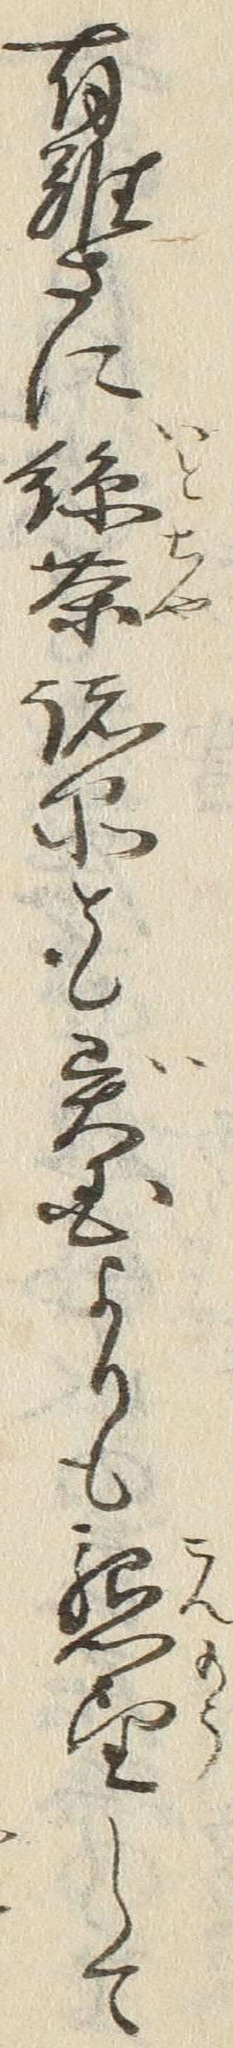有難さに絲茶諸品とも異國よりも懇望して
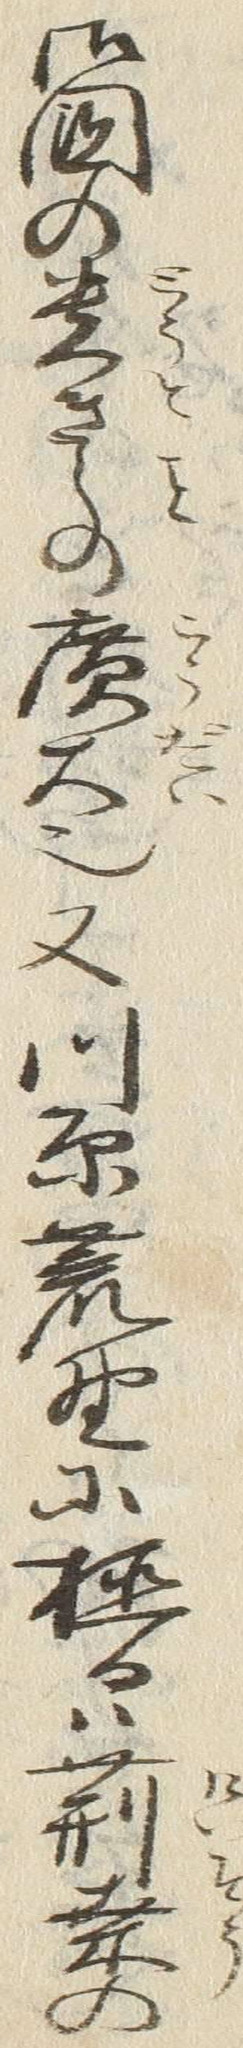御國の貴き事廣大也又川原荒野尓植るは荊桑の
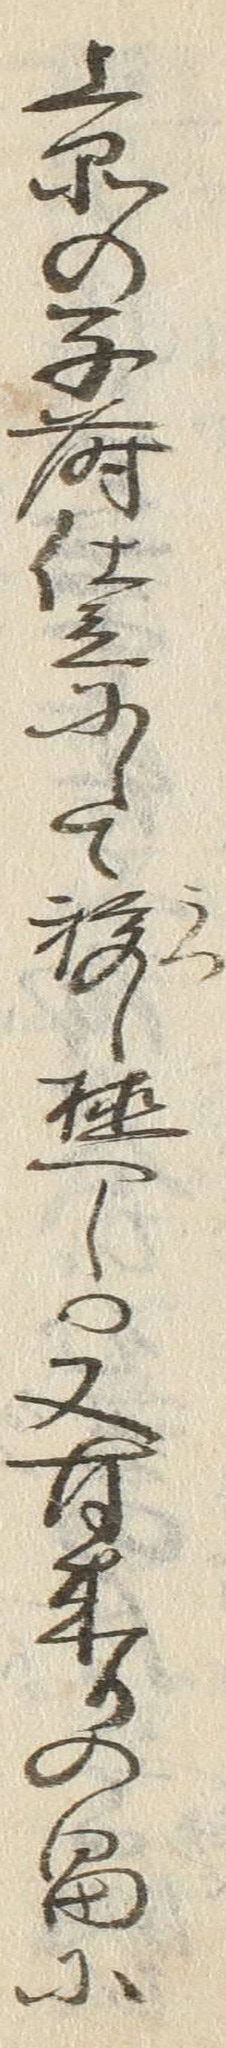上品の子蒔仕立尓して移し植へし〇又有来りの畠尓
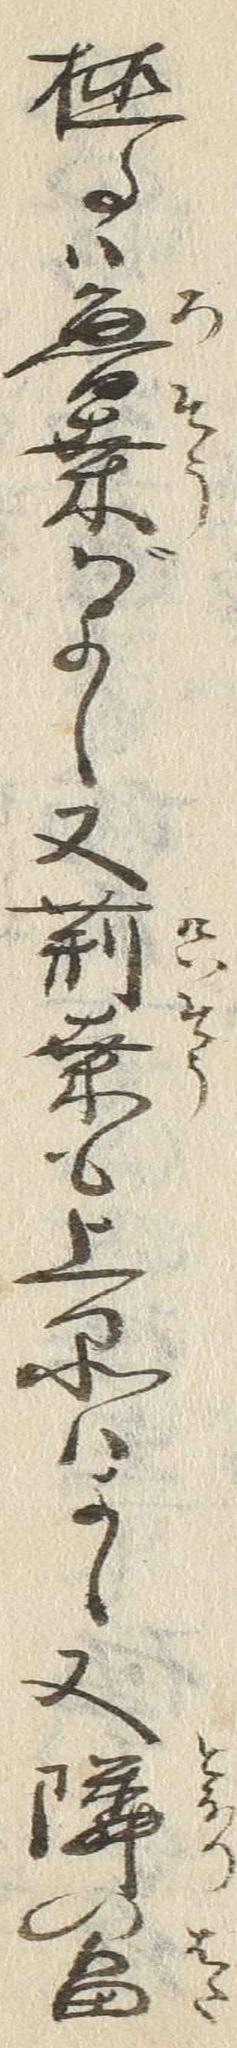植るは魯桑がよし又荊桑も上品はよし又隣の畠
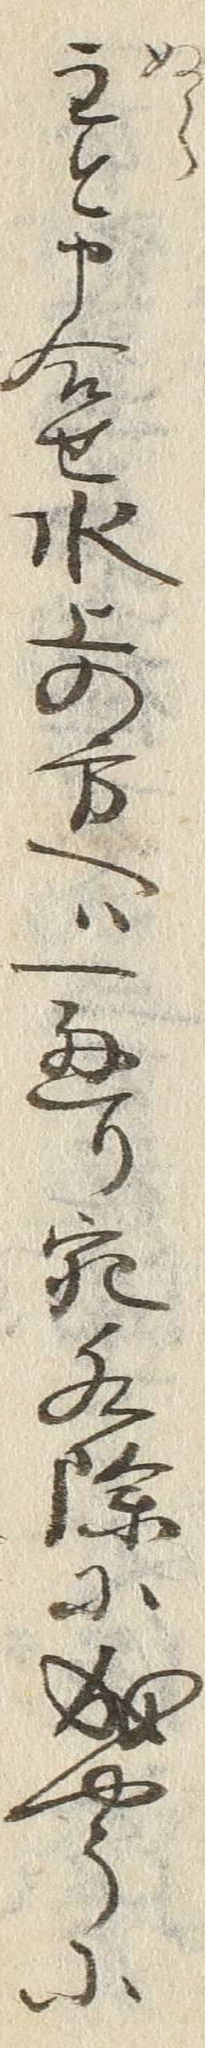主と申合せ水上の方へは一通り宛水際尓成やう尓
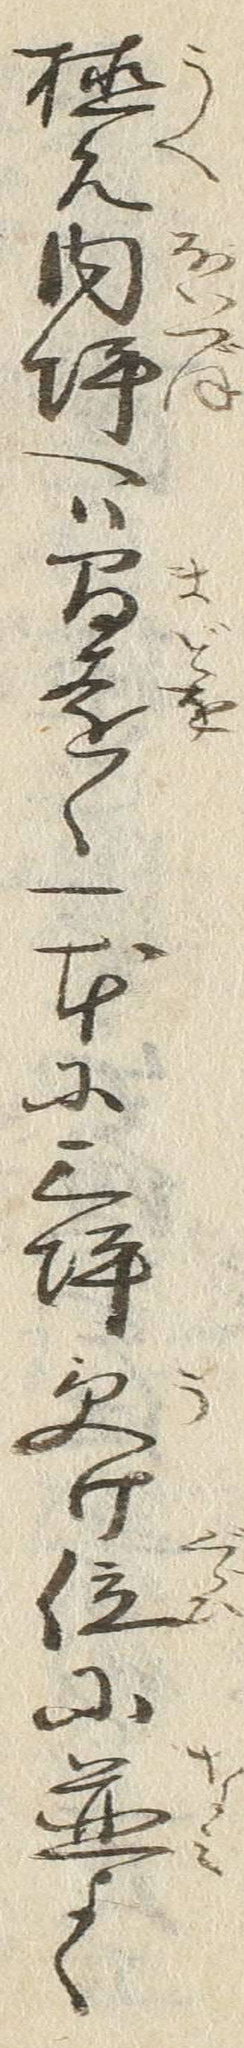植え内坪へは間遠く一本尓三坪受け位尓並よく
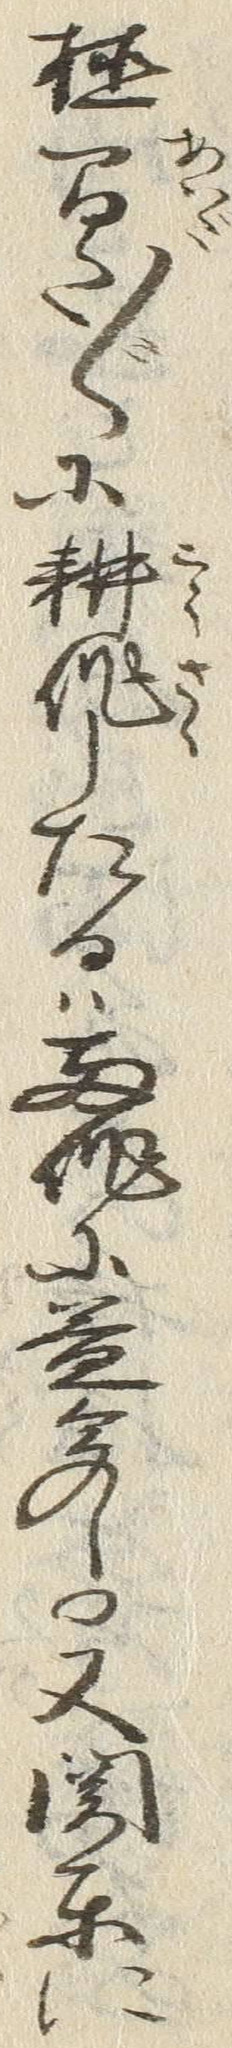植間だ〴〵尓耕作したるは両作尓益多し〇又関東に
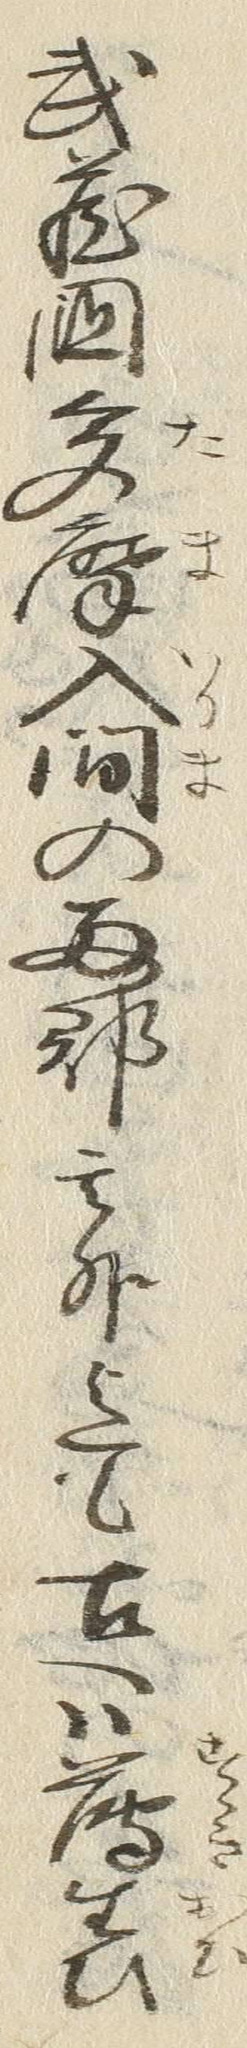武蔵國多摩入間の両郡其外迄も古へは薄生ひ
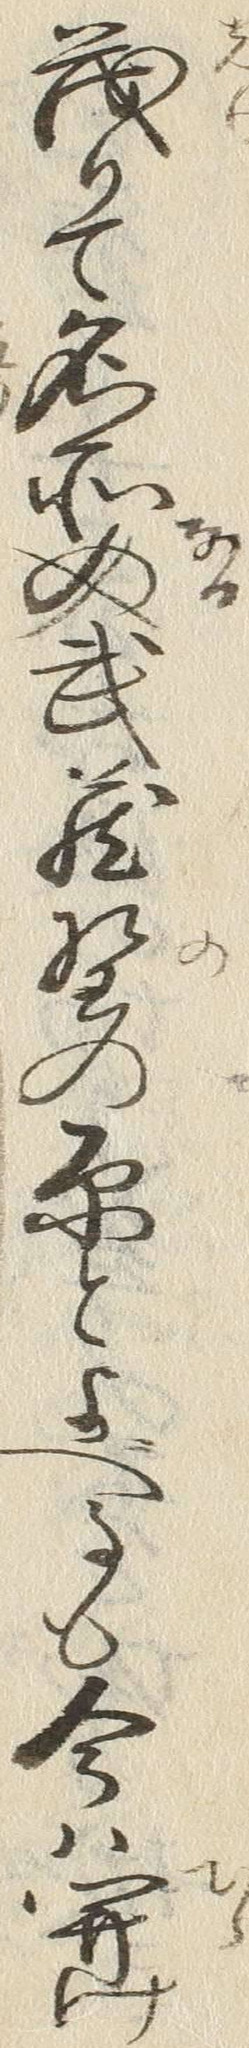茂りて名所なる武蔵野の原とよべるも今は開け
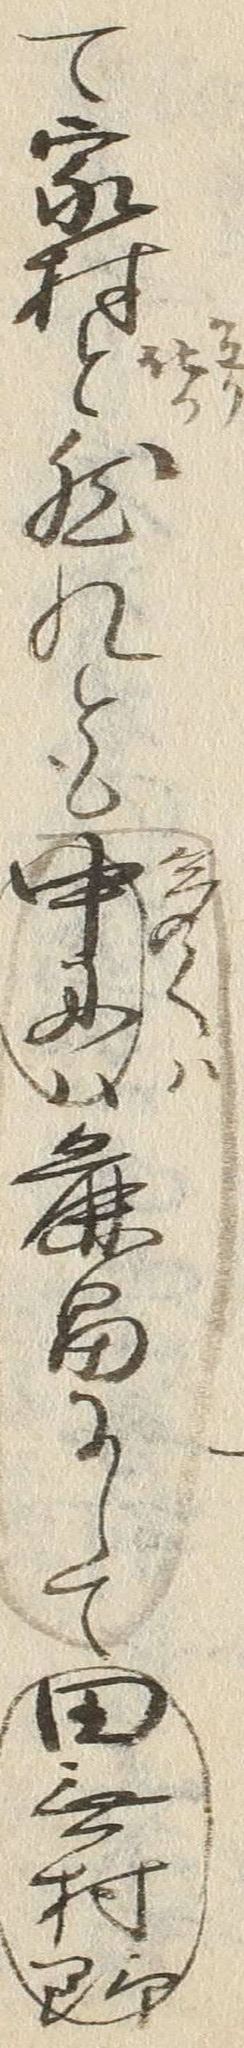て家村とかわり然れとも多くは廉畠尓して田無村野
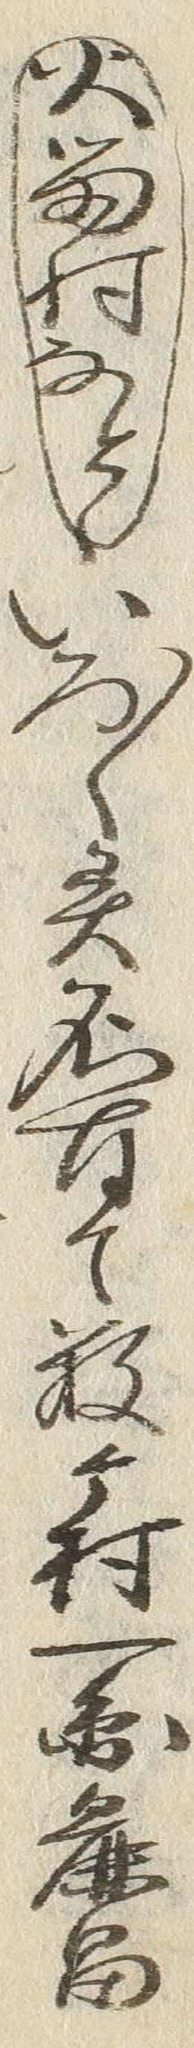火留村なとゝいろ〳〵異名有て数ヶ村一圓廉畠
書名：養蠶實驗録後編
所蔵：東京大学農学生命科学図書館 国文学研究資料館
